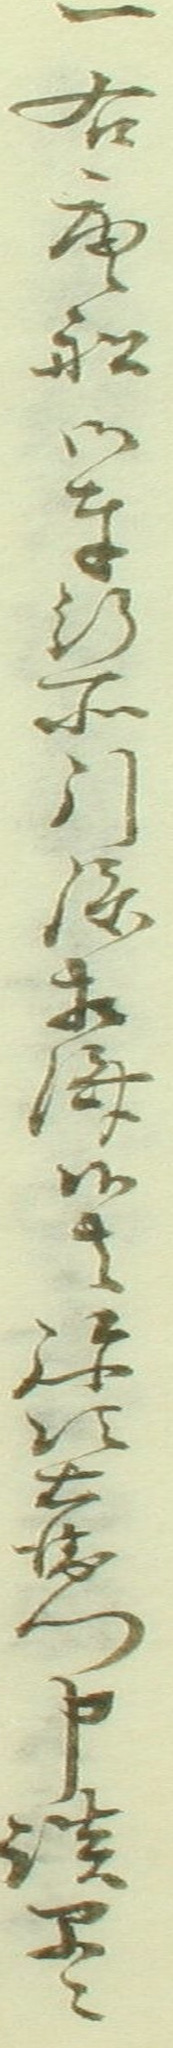一右唐船御奉行所引渡相済候は弥次右衛門申談早々
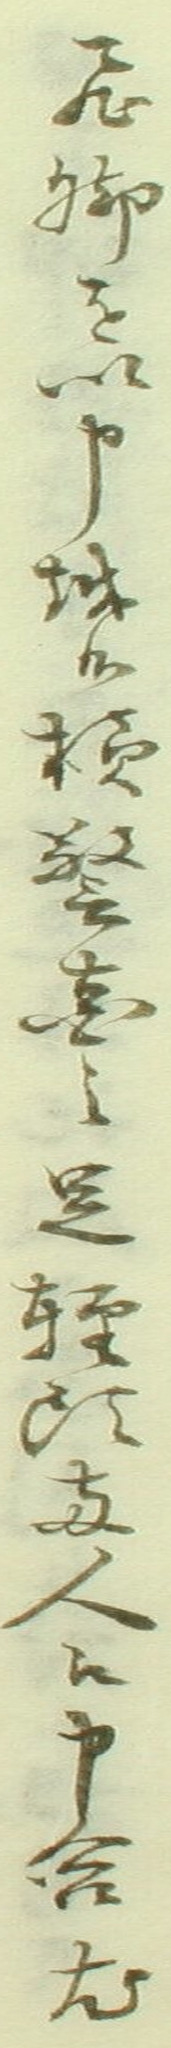飛脚を以申越候様警固之足軽頭両人え申含尤
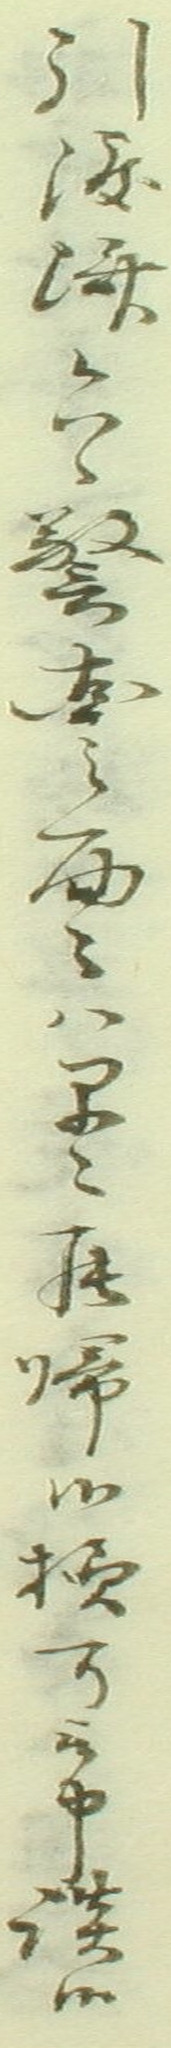引渡済候はゝ警固之面々は早々罷帰候様可被申談候
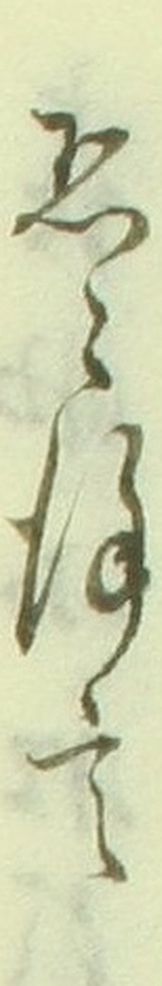恐々謹言
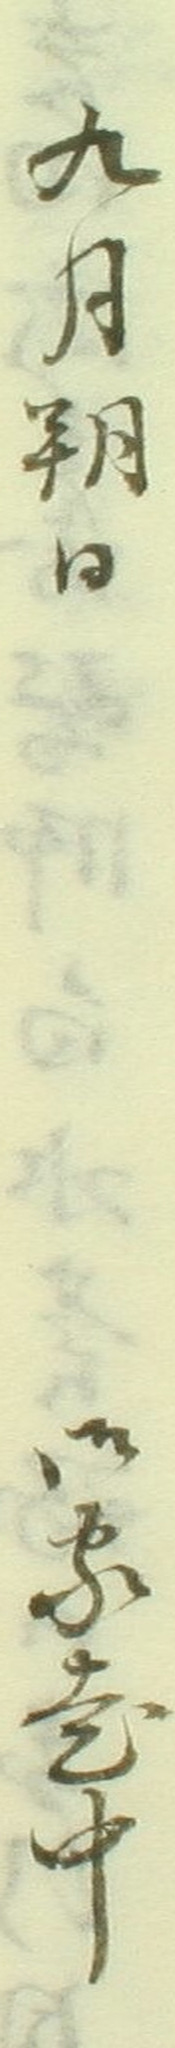九月朔日御家老中
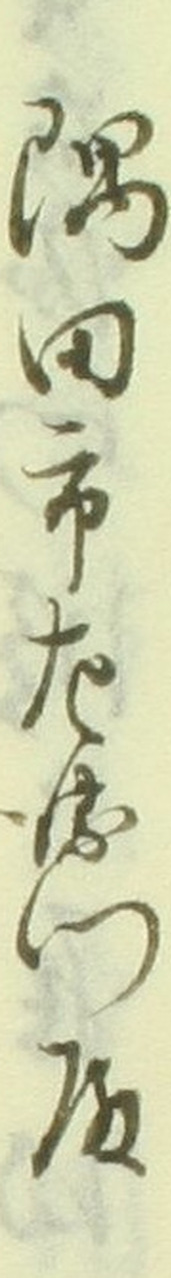隅田市左衛門殿
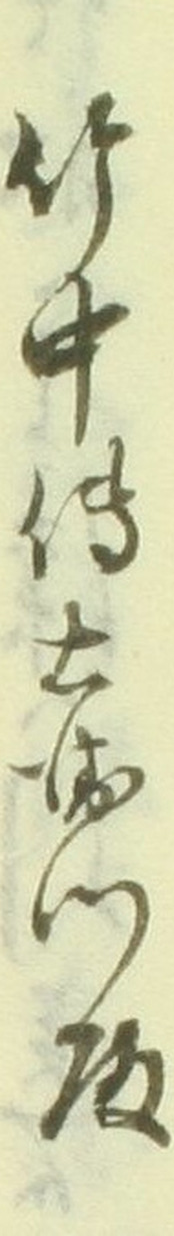竹中伝右衛門殿
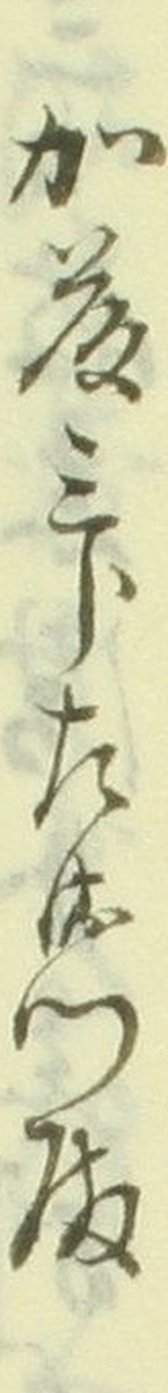加藤三郎左衛門殿
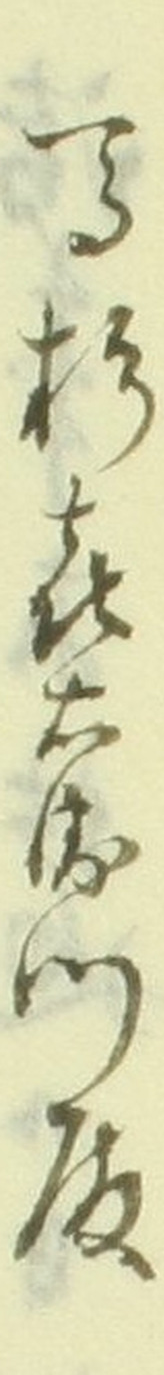馬杉喜右衛門殿
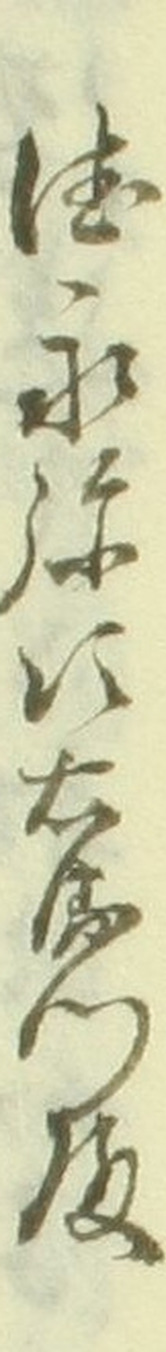徳永弥次右衛門殿
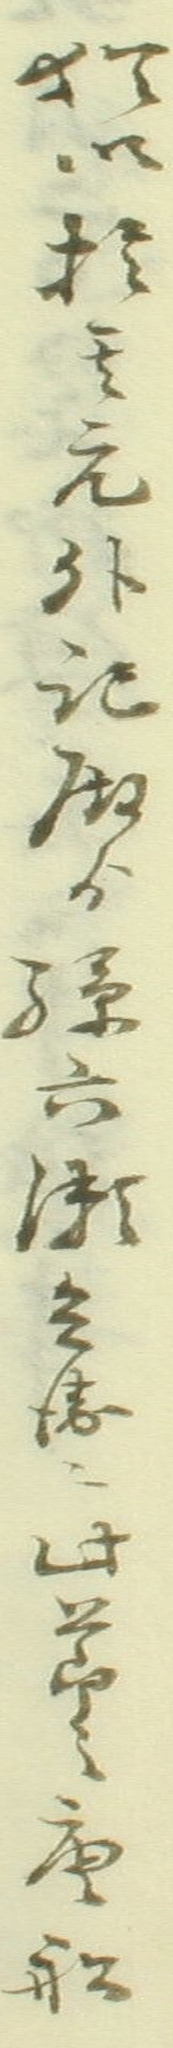猶御於其元外記殿ゟ孫六瀬兵衛に此節之唐船
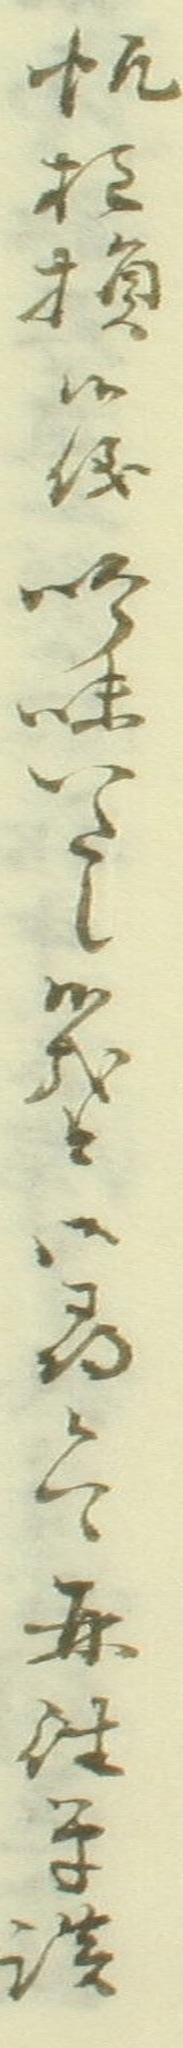帆柱損候儀吟味いたし候哉と御尋候はゝ再往筆談
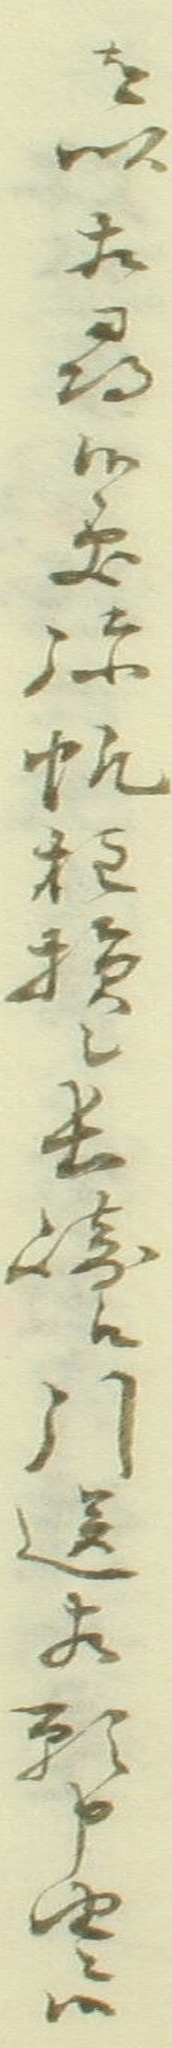を以相尋候処弥帆柱損し長崎え引送相願申由に候
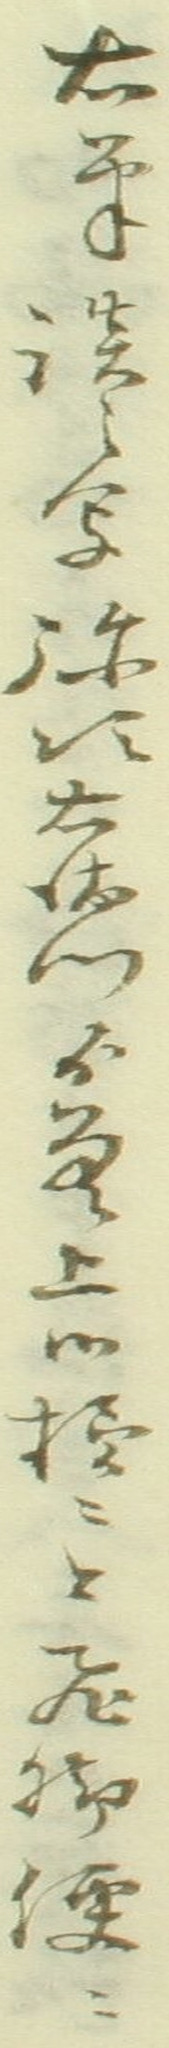右筆談之写弥次右衛門ゟ差上候様にと飛脚便に
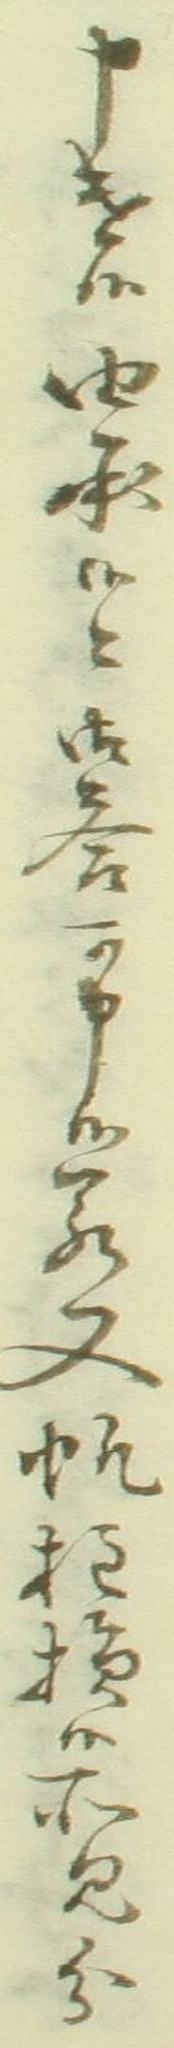申遣候由承候と御答可申候若又帆柱損候所見分
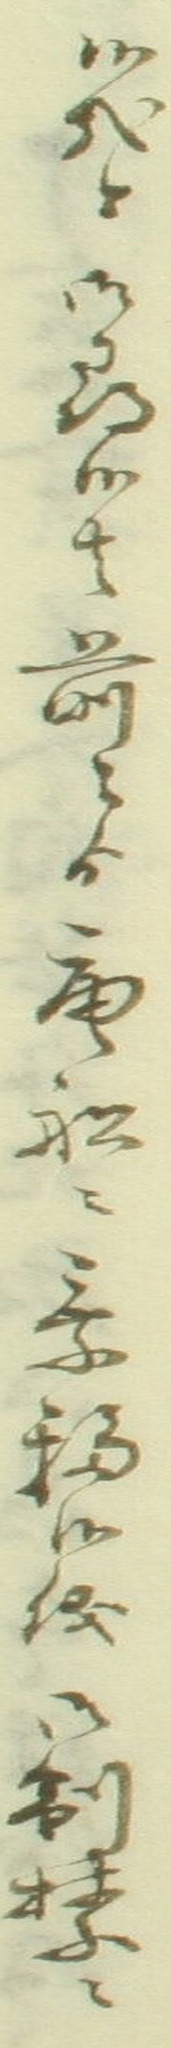候哉と御尋候は前々ゟ唐船に乗移候儀御制禁に
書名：異国船漂着記
